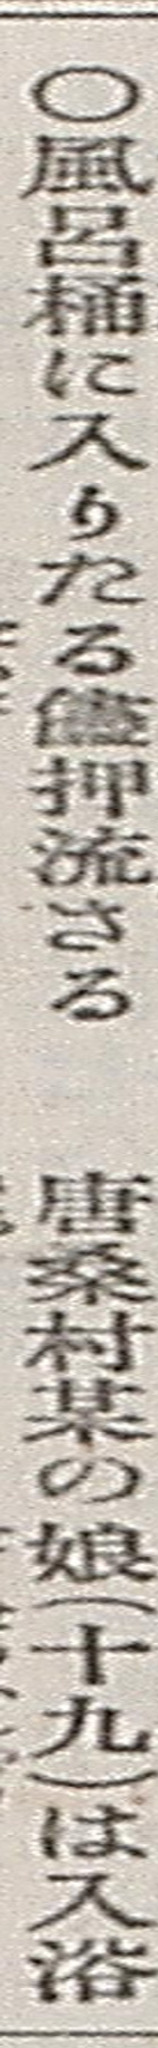○風呂桶に入りたる侭押流さる唐桑村某の娘は入浴
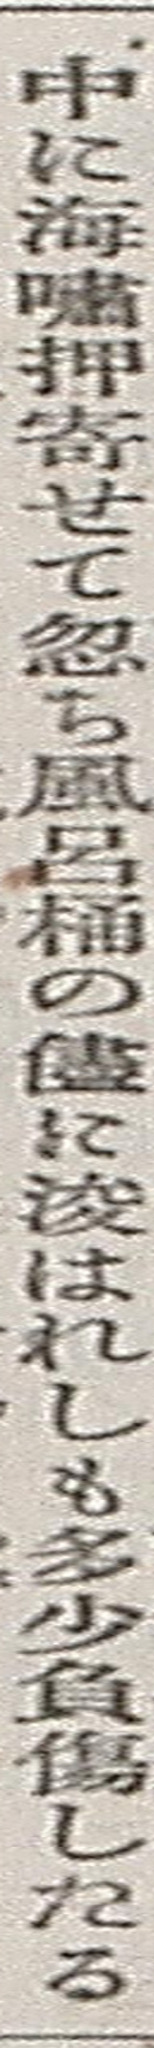中に海嘯押寄せて忽ち風呂桶の侭に浚はれしも多少負傷したる
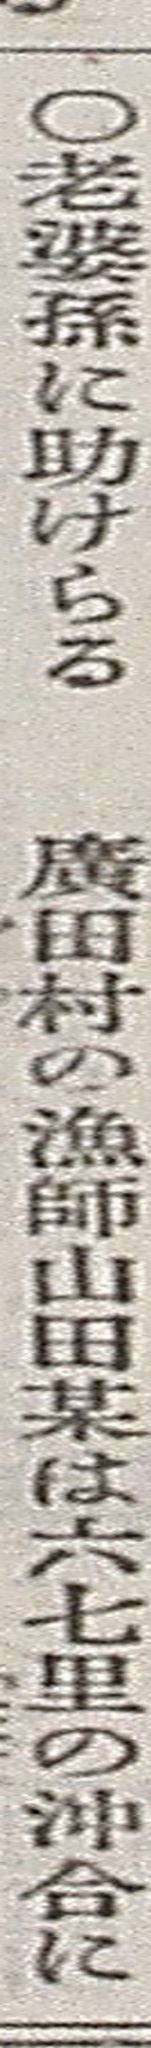○老婆孫に助けらる広田村の漁師山田某は六七里の沖合に
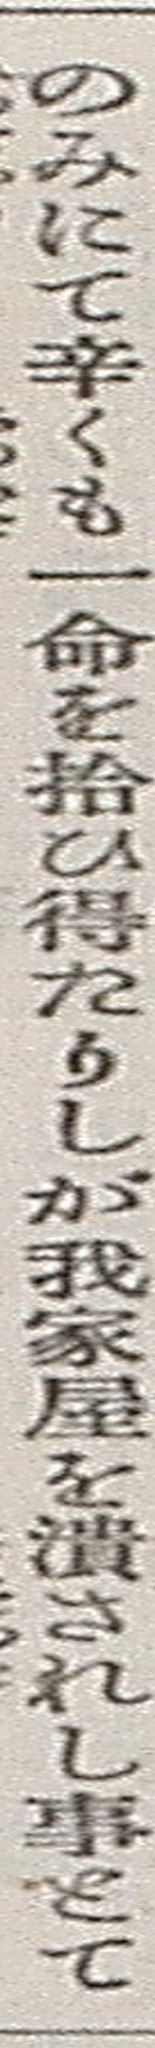のみにて辛くも一命を拾ひ得たりしが我家屋を潰されし事とて
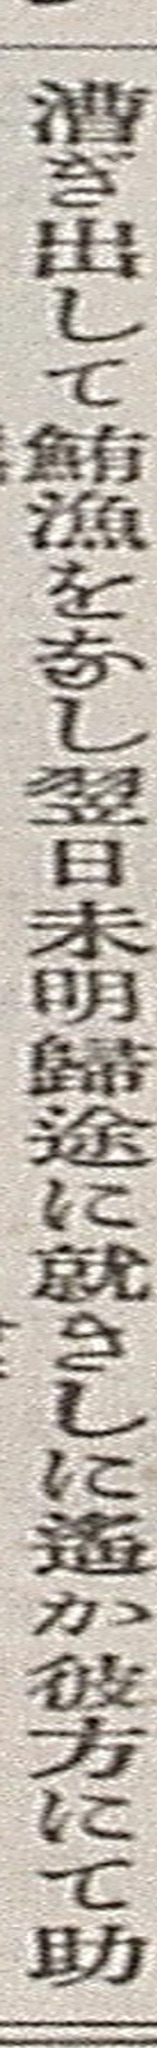漕ぎ出して鮪漁をなし翌日未明帰途に就きしに遙か彼方にて助
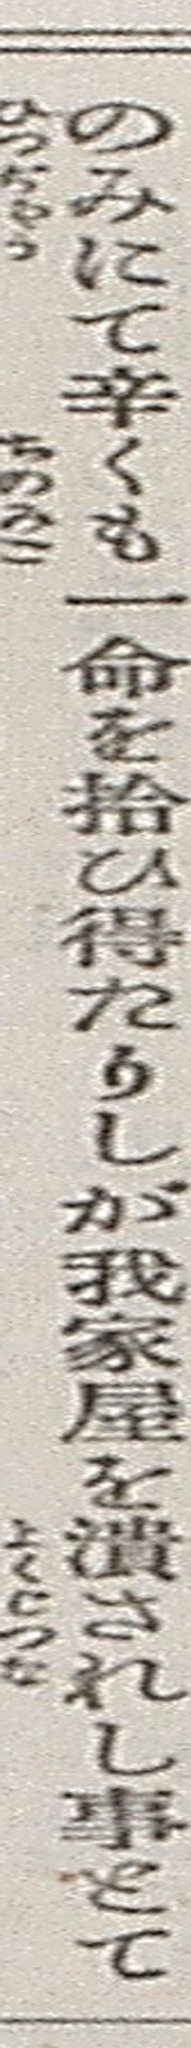のみにて辛くも一命を拾ひ得たりしが我家屋を潰されし事とて
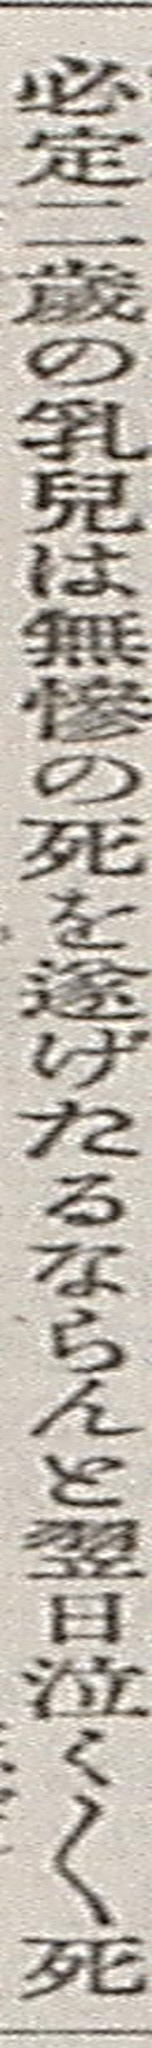必定二歳の乳児は無惨の死を遂げたるならんと翌日泣く〳〵死
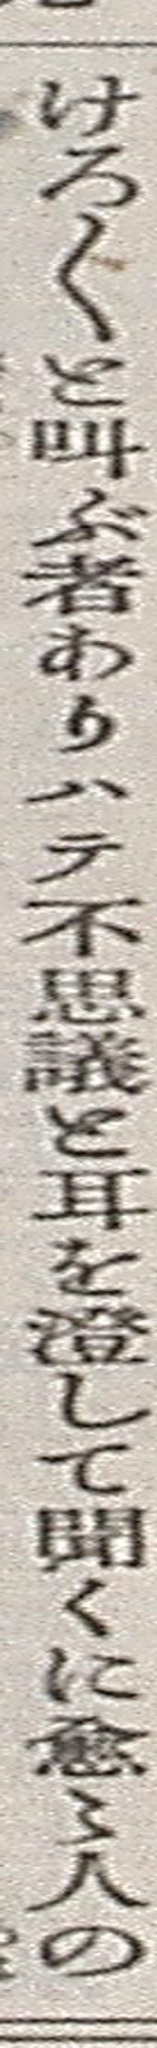けろ〳〵と叫ぶ者ありハテ不思議と耳を澄して聞くに愈々人の
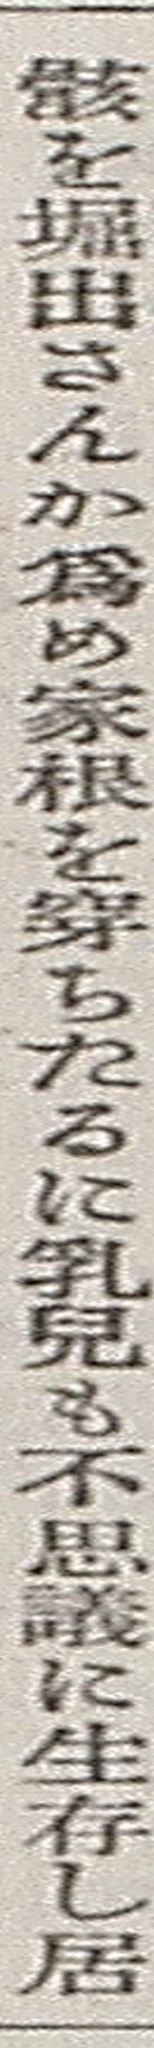骸を堀出さんか為め家根を穿ちたるに乳児も不思議に生存し居
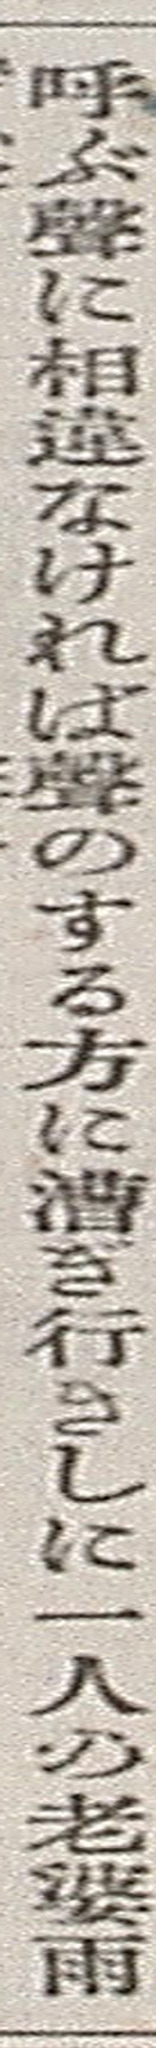呼ぶ声に相違なければ声のする方に漕ぎ行きしに一人の老婆雨
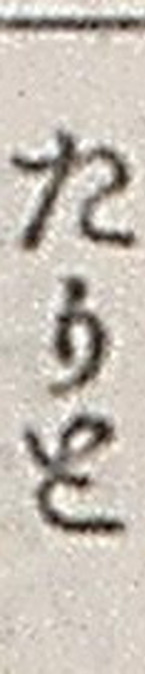たりと
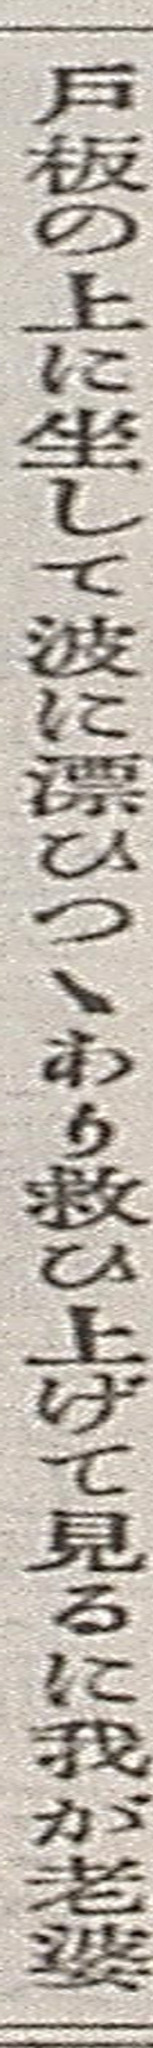戸板の上に坐して波に漂ひつゝあり救ひ上げて見るに我が老婆
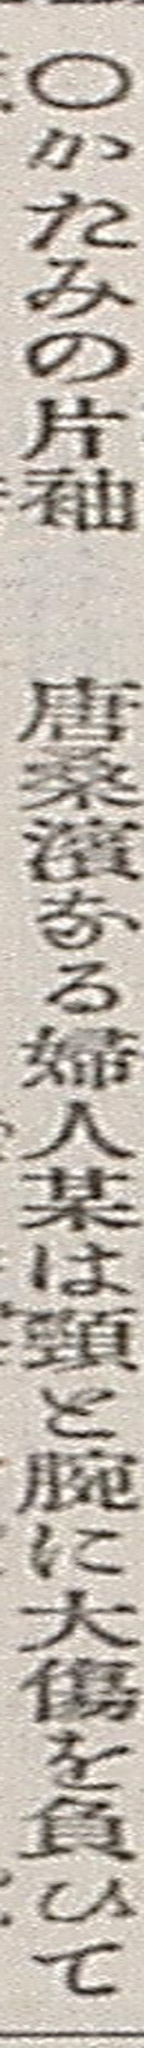○かたみの片袖唐桑浜なる婦人某は頸と腕に大傷を負ひて
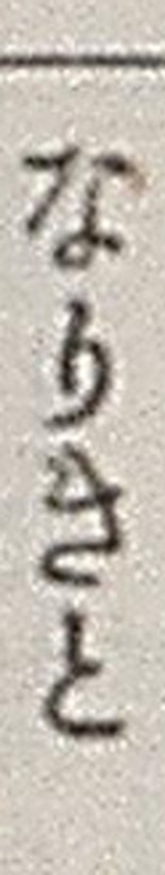なりきと
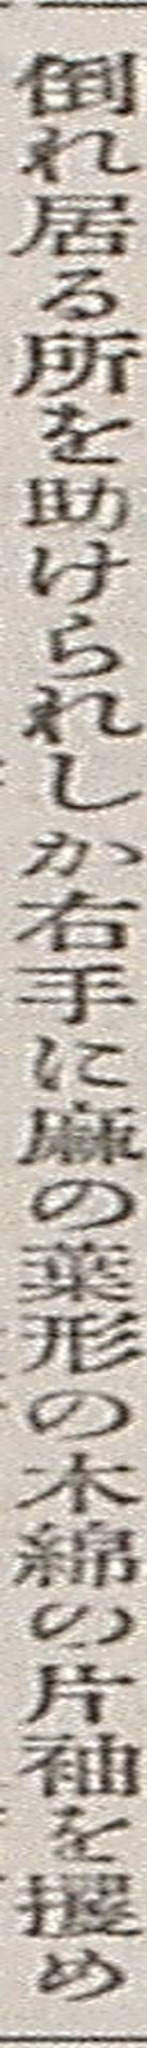倒れ居る所を助けられしか右手に麻の葉形の木綿の片袖を攫め
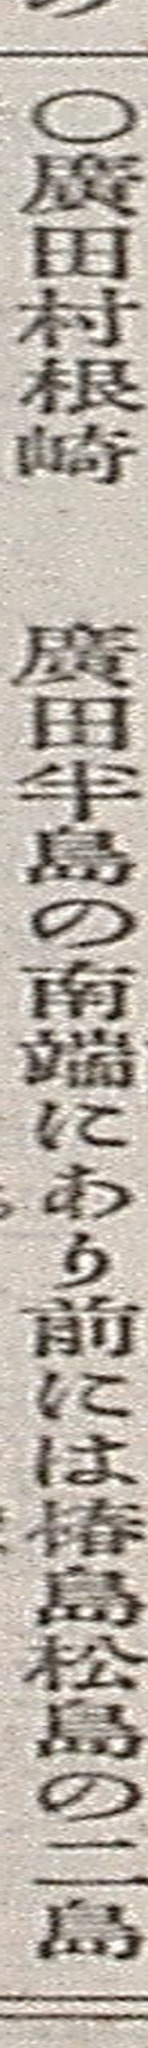○広田村根崎広田半島の南端にあり前には椿島松島の二島
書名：風俗畫報臨時増刊第百十九號　大海嘯被害録（中）
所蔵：東京大学地震研究所図書室 Earthquake Research Institute Library, The University of Tokyo, JAPAN
